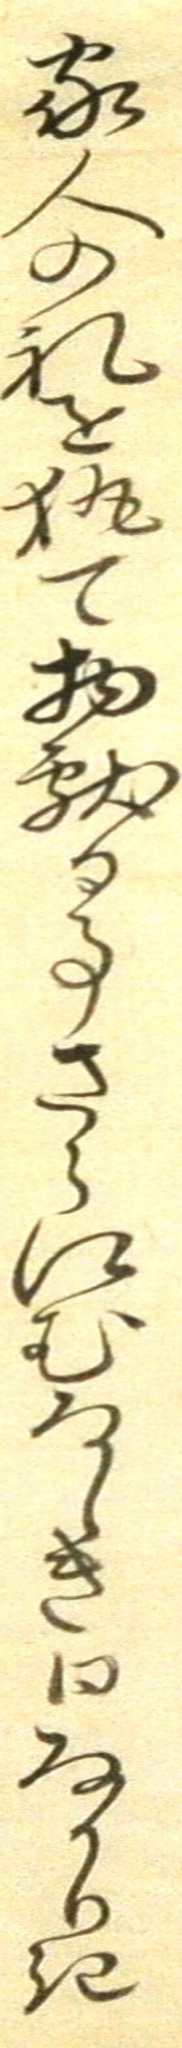家人の礼を執て物献る事さらにむなしき日なかりき
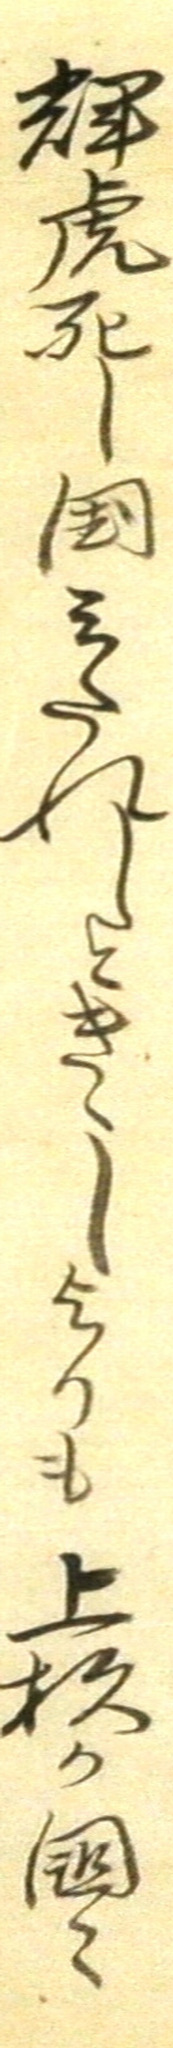輝虎死し国みたれしときゝしよりも上杉か国々
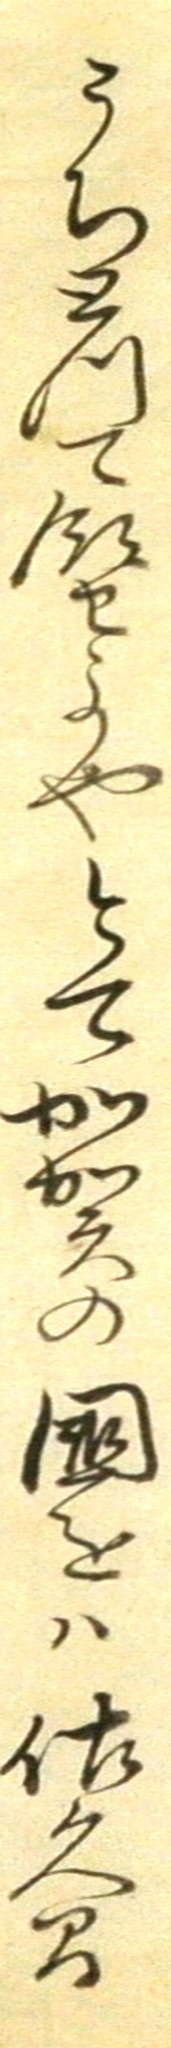うちとつて領せよやとて加賀の国をは佐久間
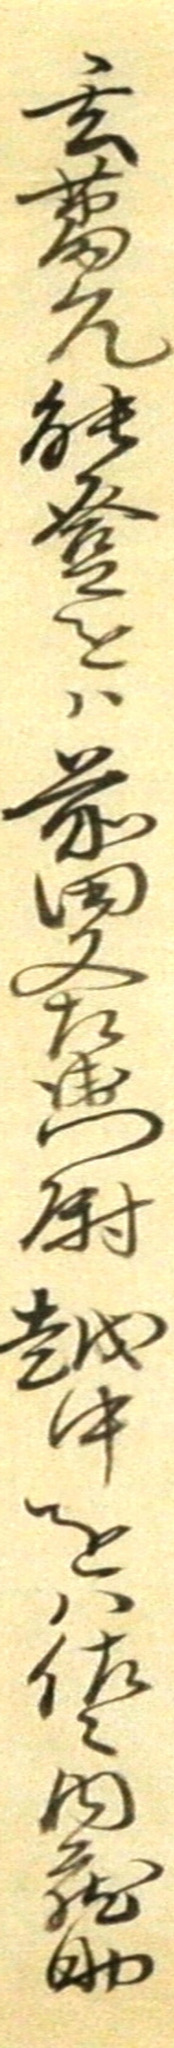玄蕃允能登をは前田又左衛門尉越中をは佐々内蔵助
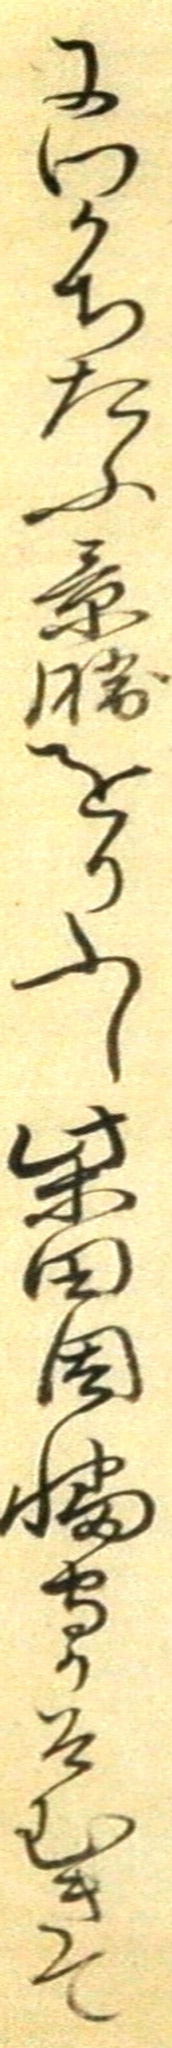にわかちたふ景勝をりふし柴田因幡守かそむきて
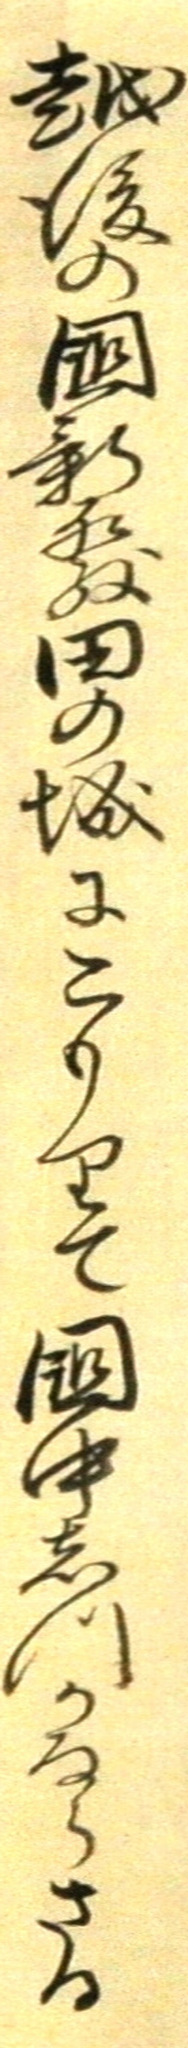越後の国新発田の城にこもりて国中しつかならさる

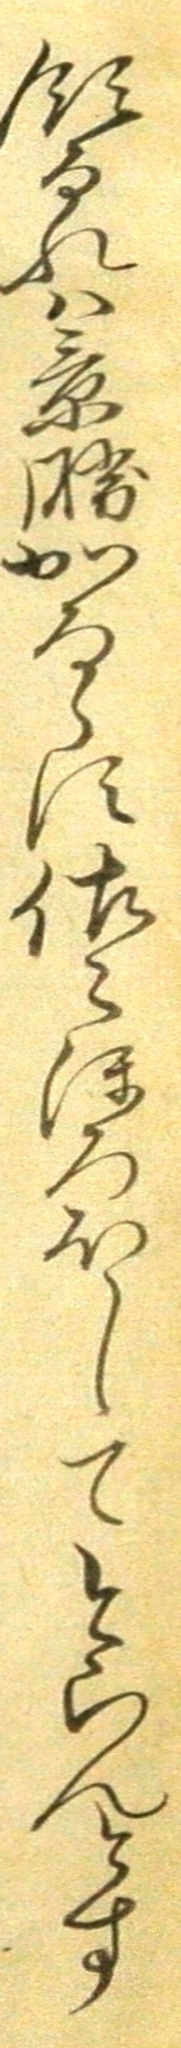領なれは景勝かならす佐々ほろほしてとらんとす
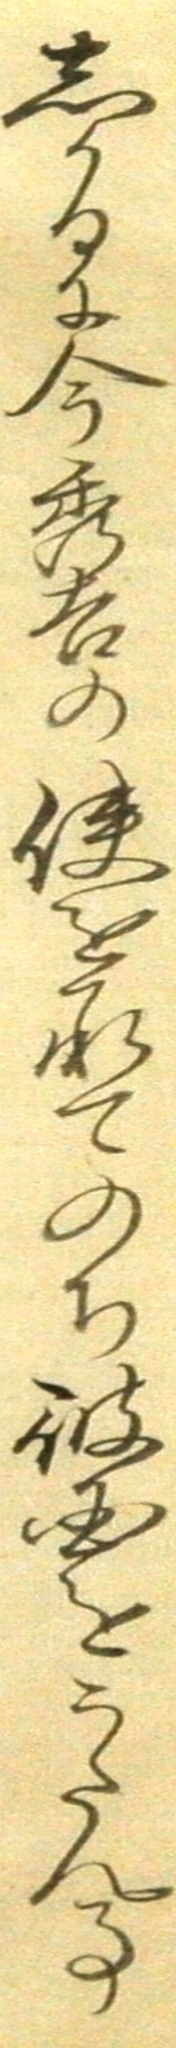しかるに今秀吉の使を承てのち彼国をうたん事
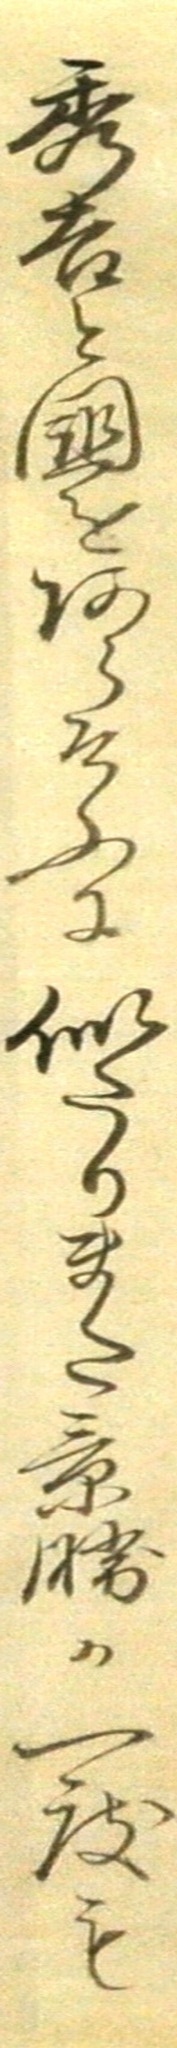秀吉と国をあらそふに似たりまた景勝か一度も
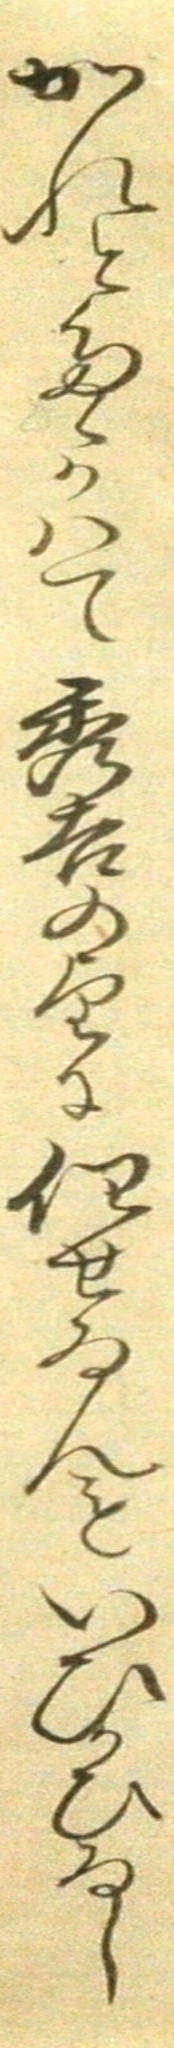かれとたゝかはて秀吉の望に任せなんもいひかひなし
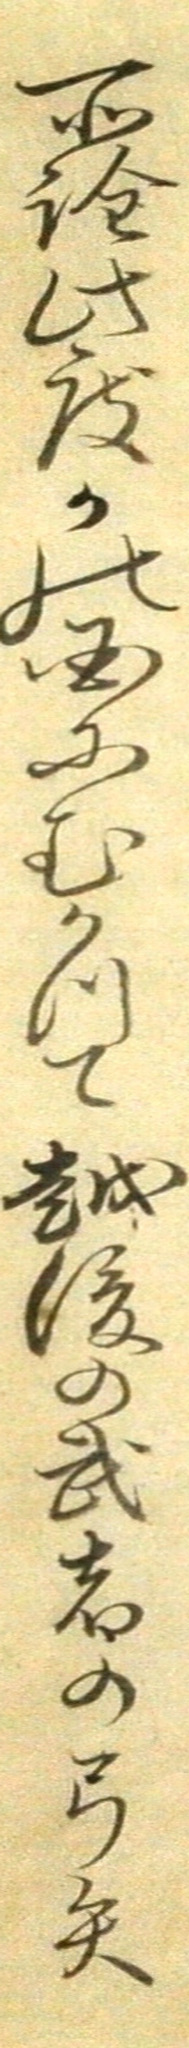所詮此度かの国にむかつて越後の武者の弓矢
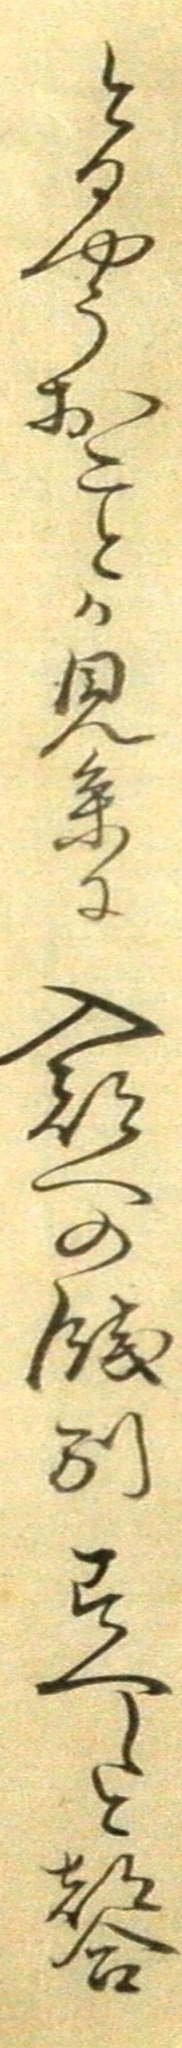とるやうおことか見参に入部への餞別すへしと都合
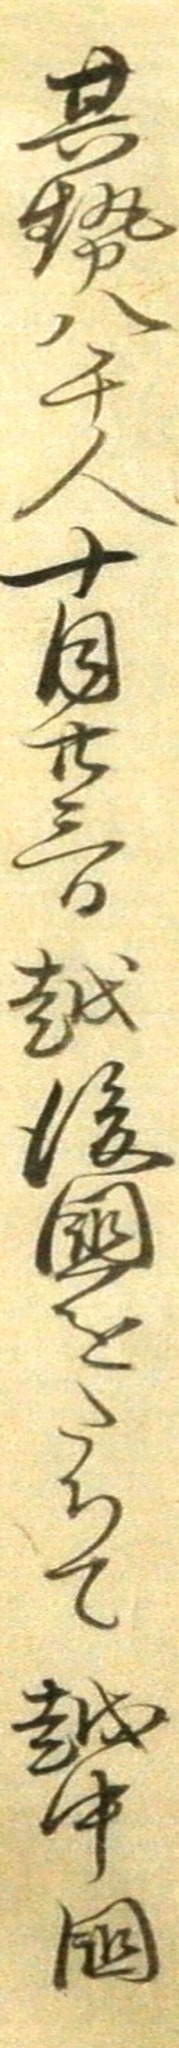其勢八千人十月廿三日越後国をたちて越中国
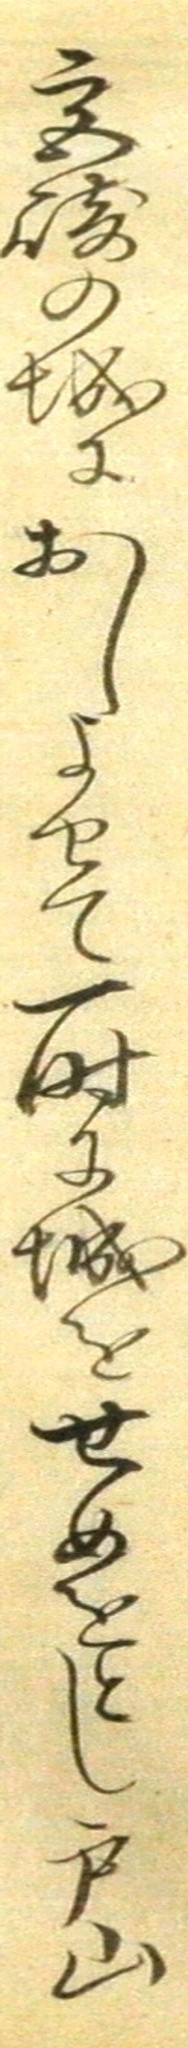宮崎の城におしよせて一時に城をせめをとし戸山
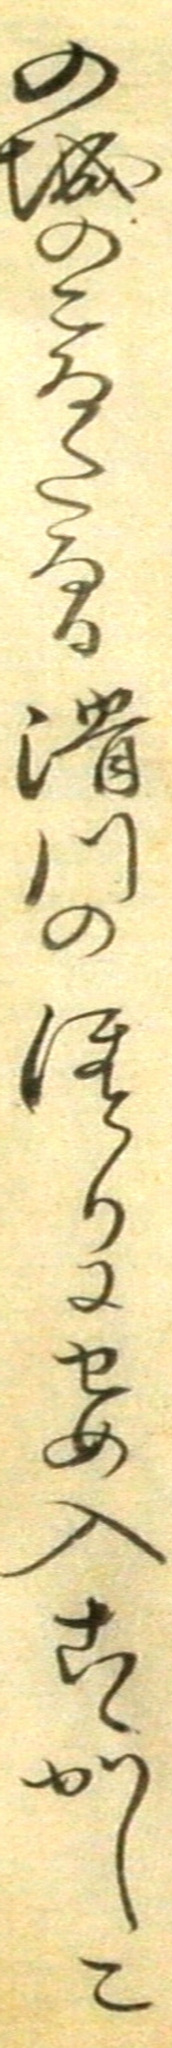の城のこなたなる滑川のほとりにせめ入こゝかしこ
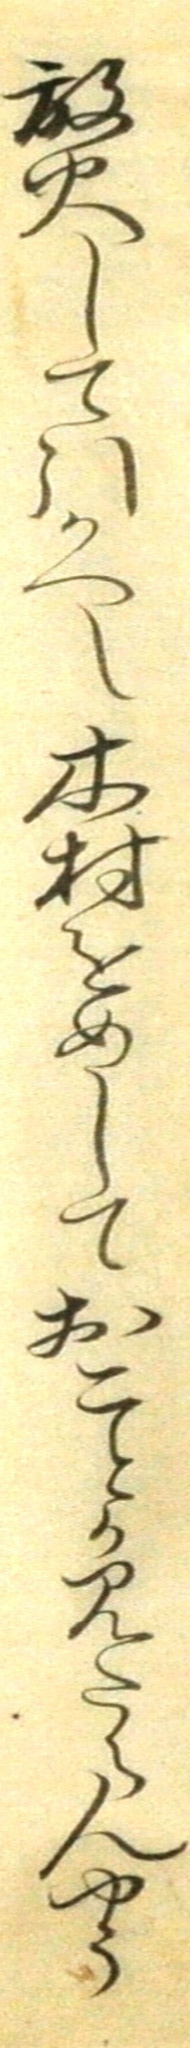放火して引かへし木村をめしておことか見たらんやう
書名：藩翰譜（八・下）
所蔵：伊那市立高遠町図書館・合同会社AMANE
